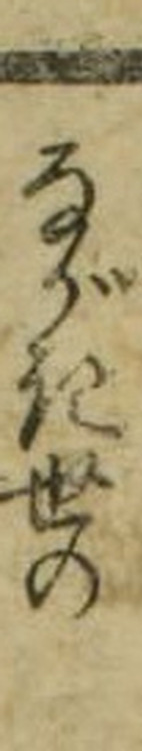ながき世の
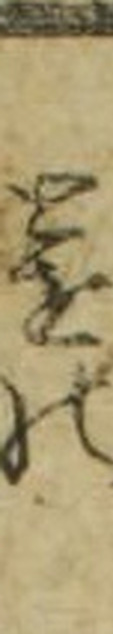とをの
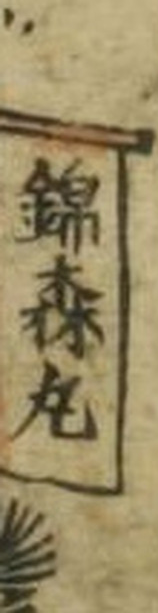錦森丸
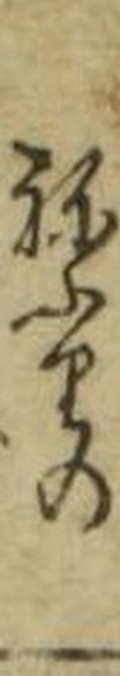ねふりの
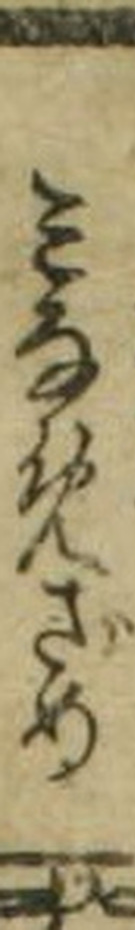みなめざめ
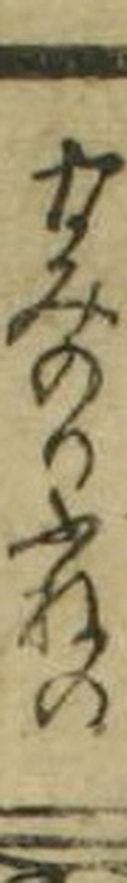なみのりふねの
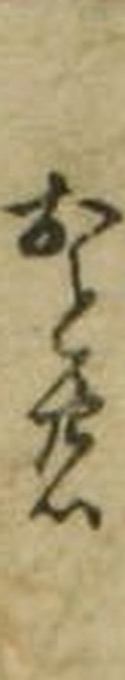おとの
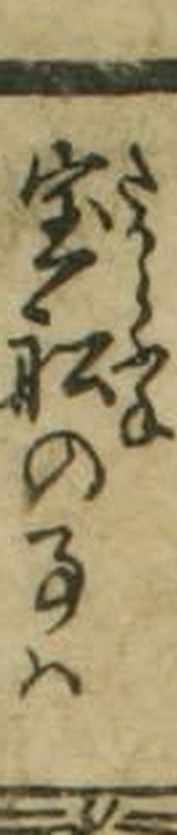宝船の事は
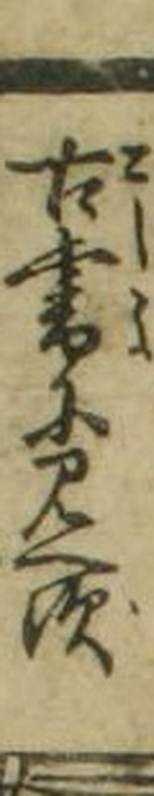古書に見へす
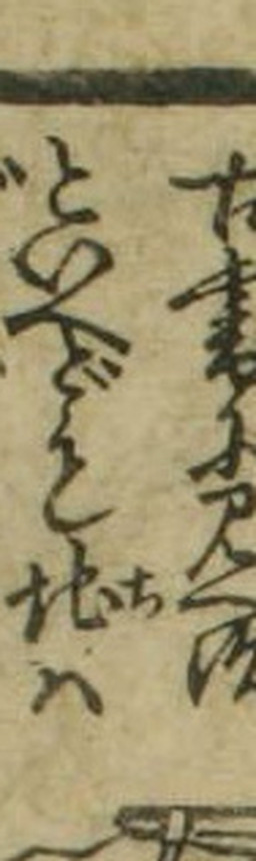といへども地は
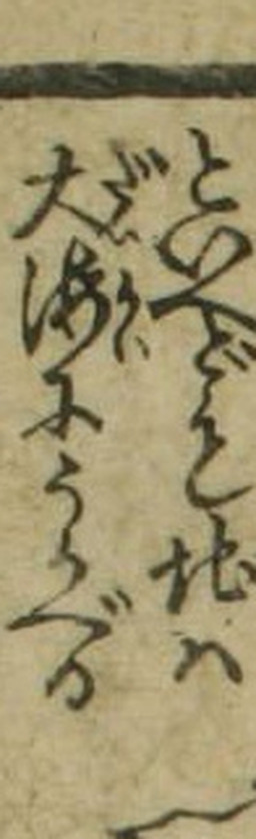大海にうかべる
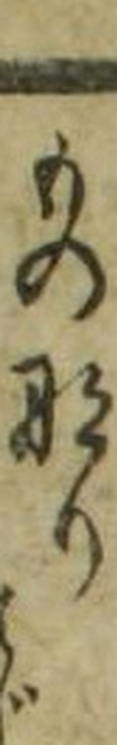ものなり
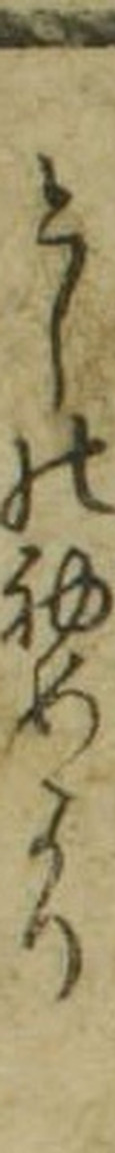としの初めより
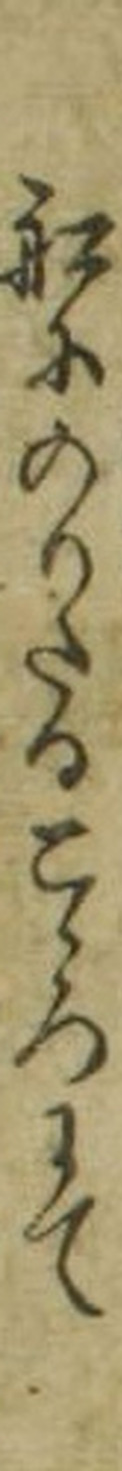船にのりたるこゝろにて
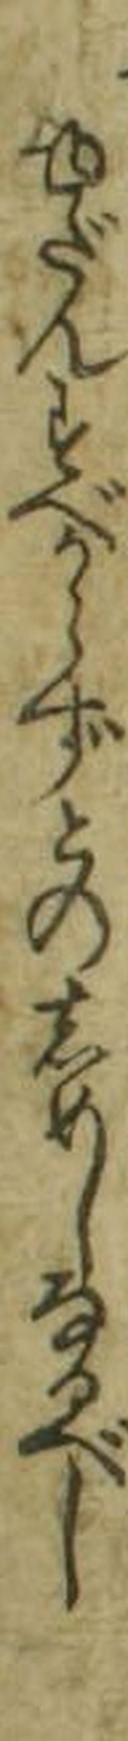ゆだんすべからずとのしめしなるべし

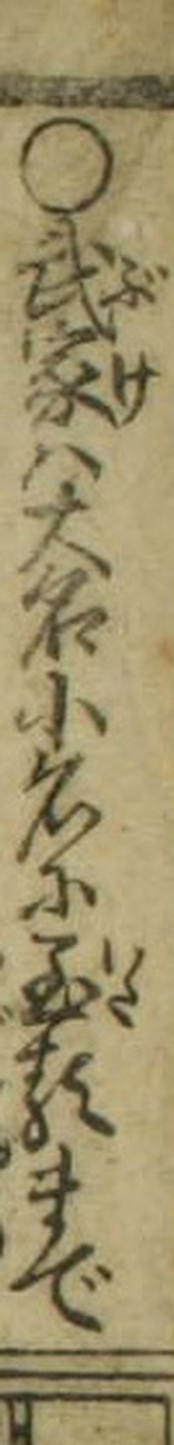○武家は大名小名に至るまで
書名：増補職人往来
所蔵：東京学芸大学教育コンテンツアーカイブ
